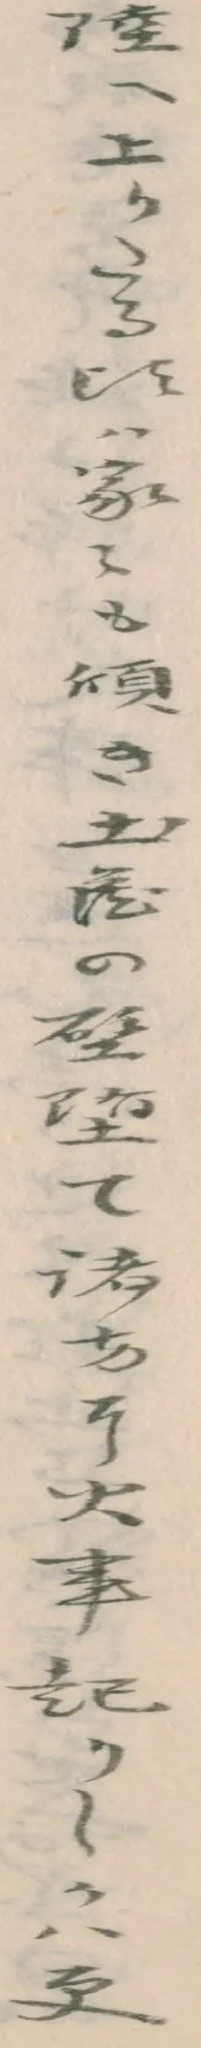陸へ上りたる頃は家々も傾き土蔵の壁堕て諸方に火事起りしかは更
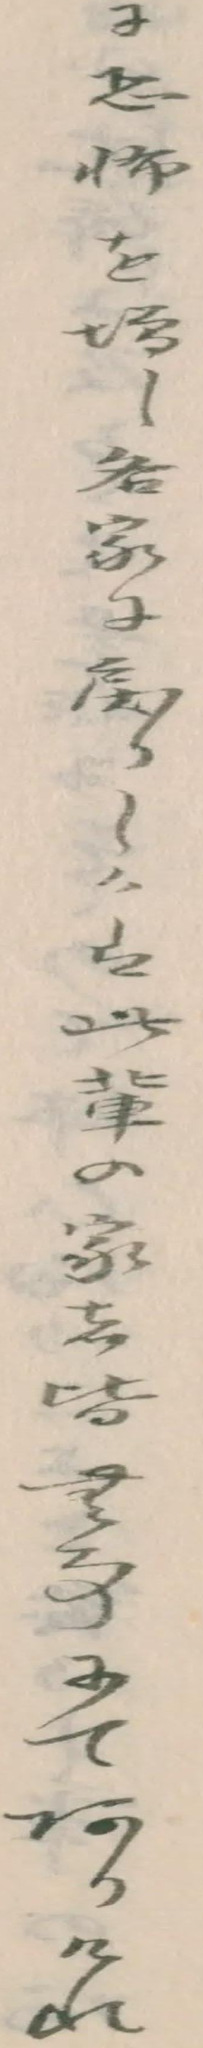に恐怖を増し各家に戻りしかは此輩の家は皆無事にてありけれ
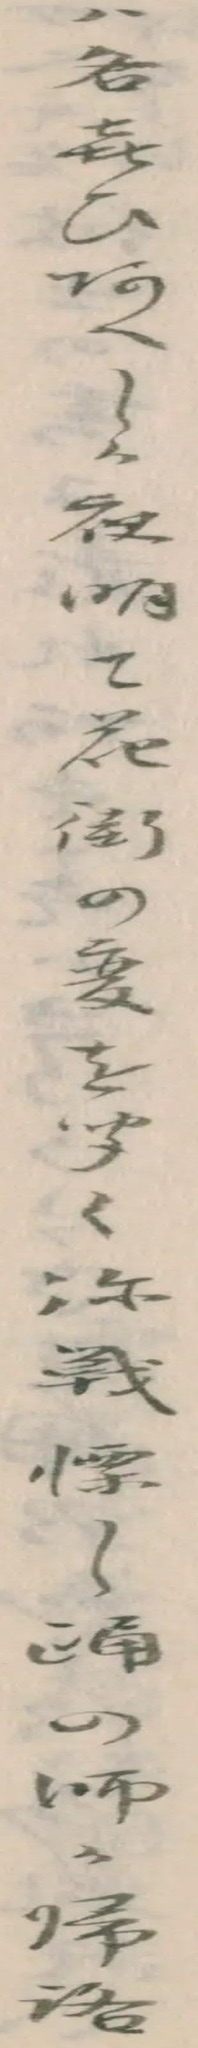は各喜ひあへしか夜明て花街の変を聞くや戦慄し踊の師か帰洛
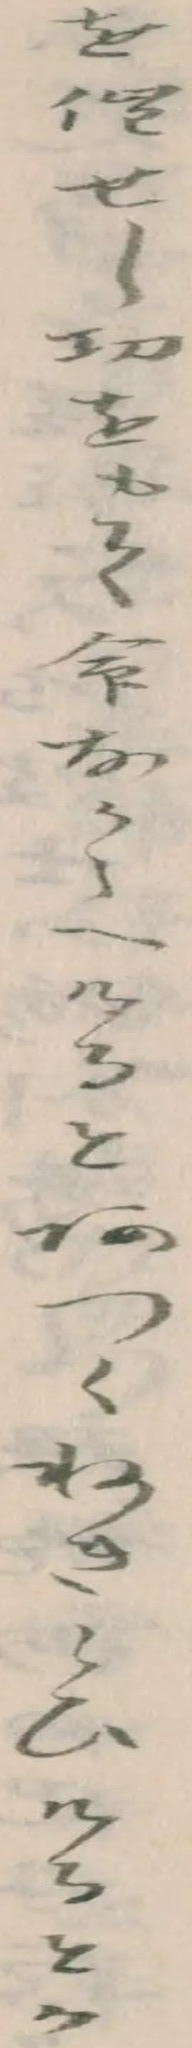を催せし功をもて命なからへけるとあつくねきらひけるとか
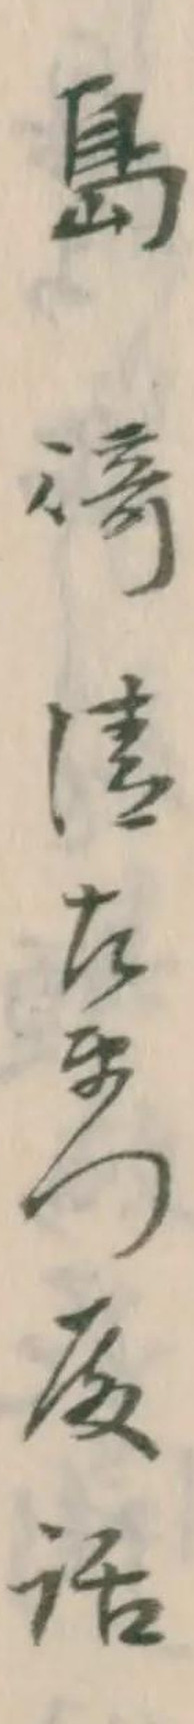島崎清左衛門殿話
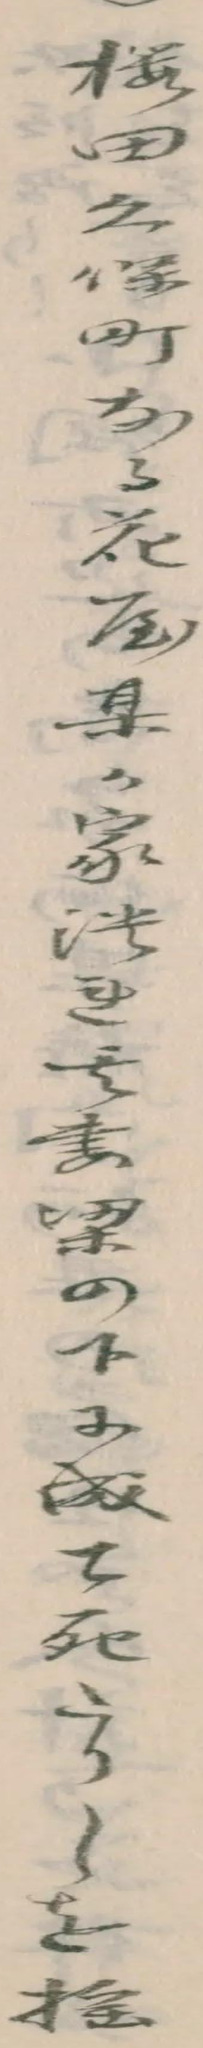〇桜田久保町なる花屋某か家潰れ其妻梁の下に成て死たりしを揺
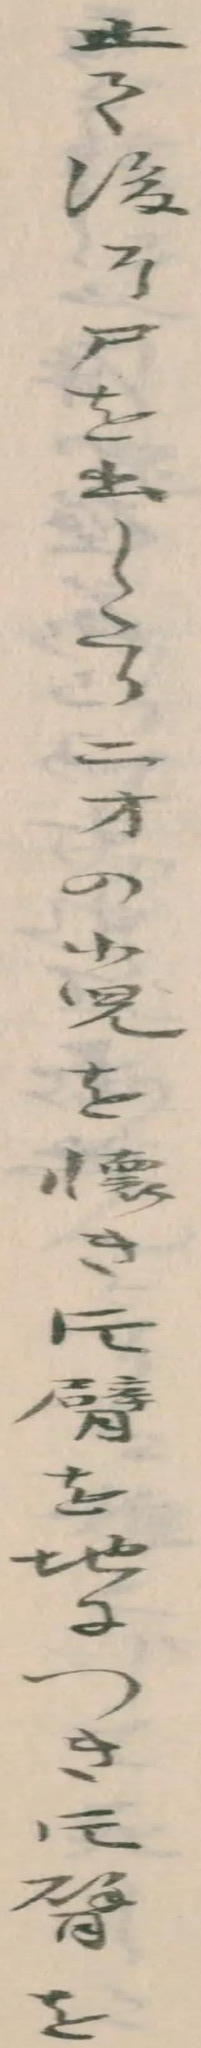止て後に尸を出したり二才の小児を懐き片臂を地につき片臂を
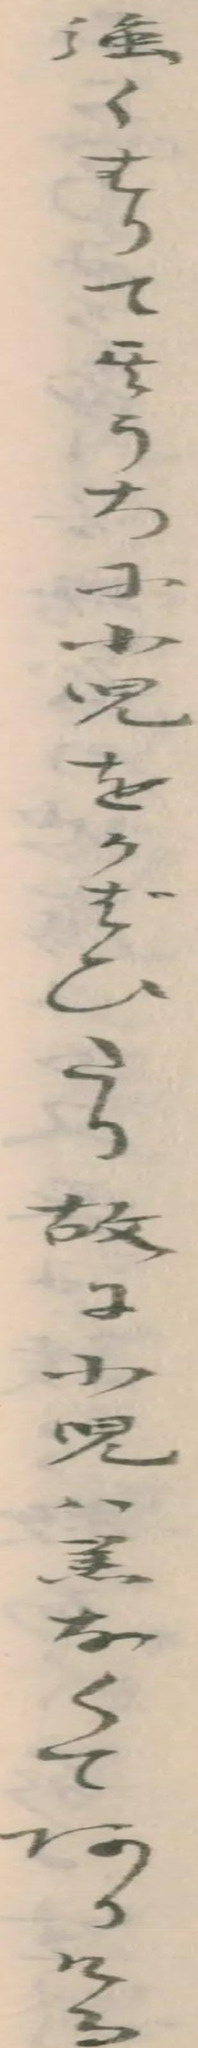強くはりて其うちに小児をかばひたり故に小児は恙なくてありける
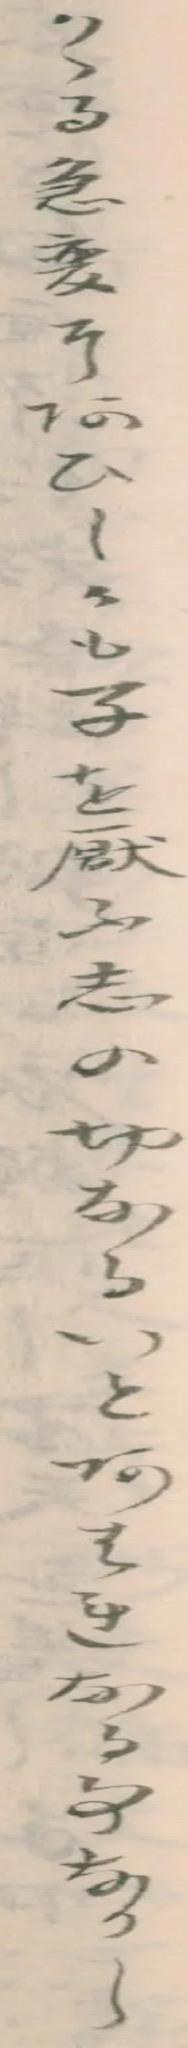かゝる急変にあひしかも子を厭ふ志の切なるいとあはれなる事なりし
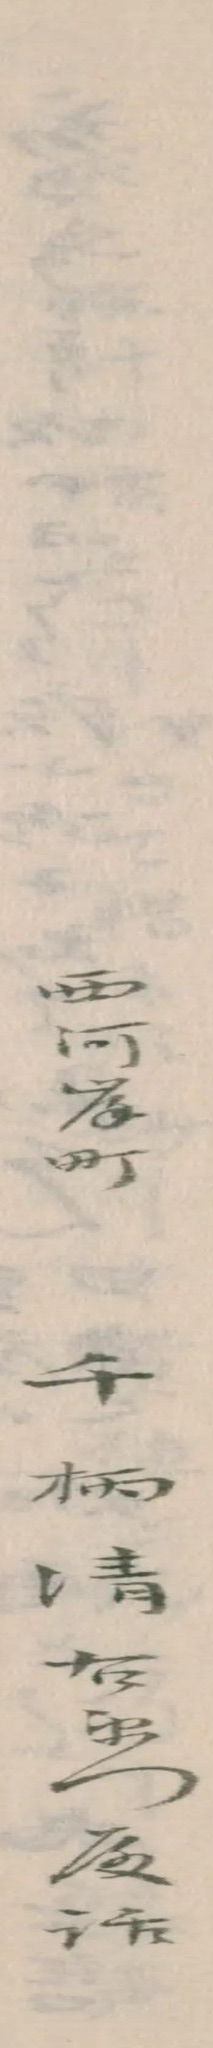西河岸町千柄清右衛門殿話
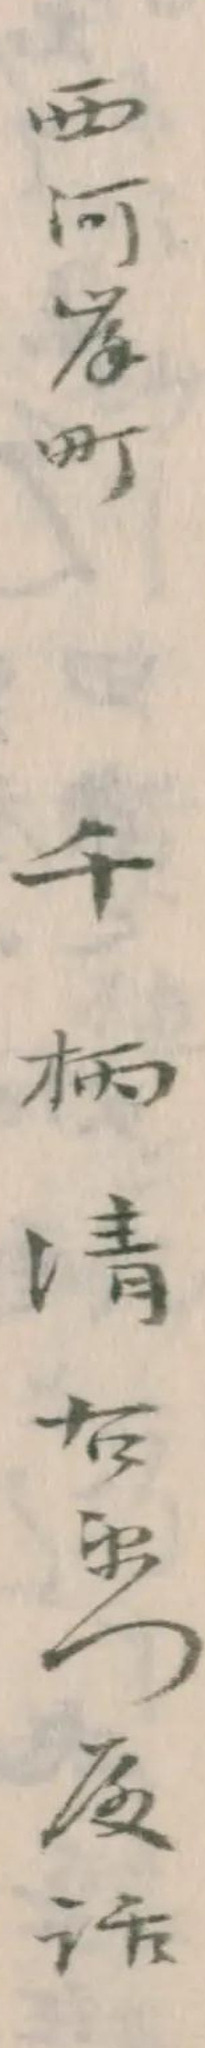西河岸町千柄清右衛門殿話
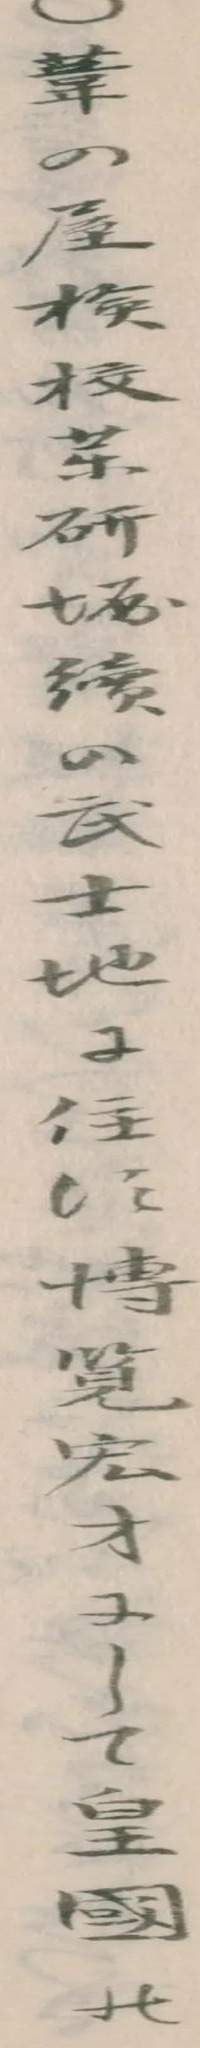〇葦の屋検校薬研堀続の武士地に住す博覧宏才にして皇国の
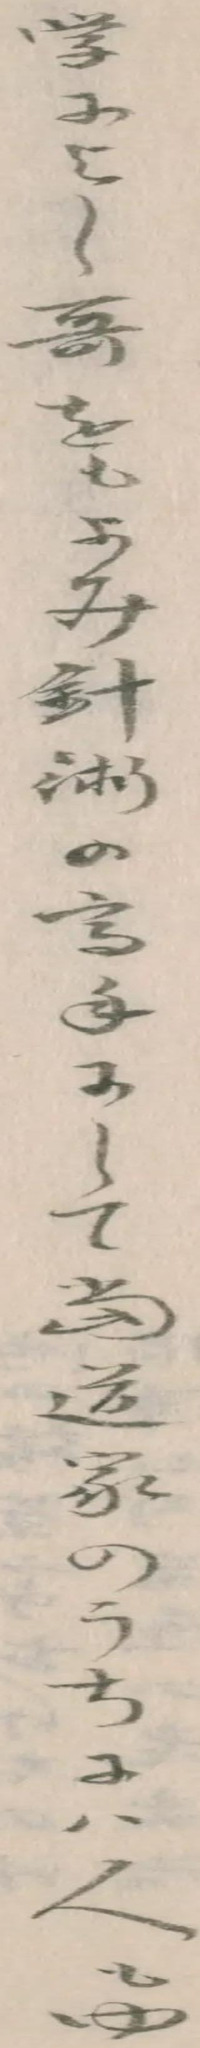学によし哥をもよみ針術の高手にして当道家のうちには人もゆ
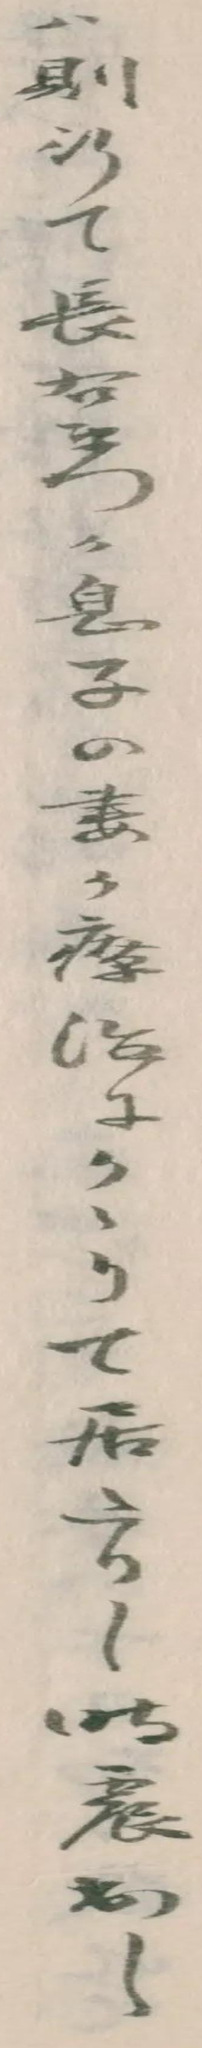は則行て長右衛門か息子の妻か療治にかゝりて居たりし時震出し
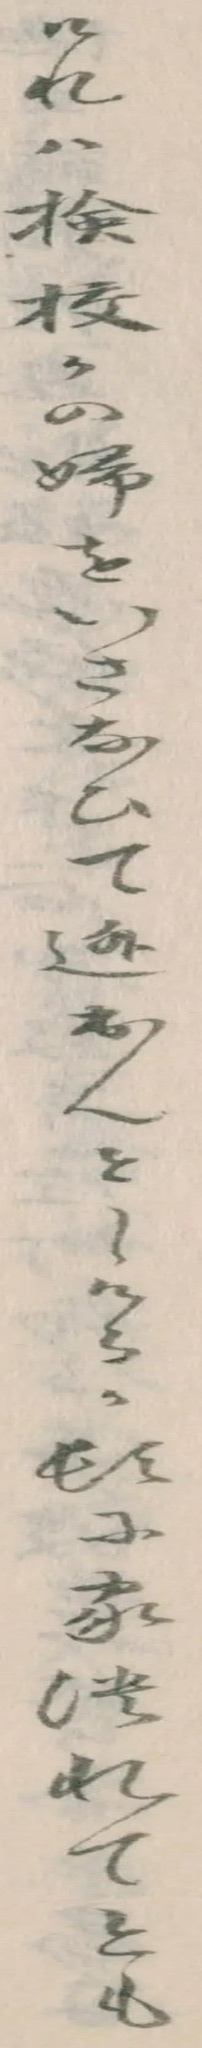けれは検校かの婦をいさなひて逃出んとしけるか頓に家潰れてとも
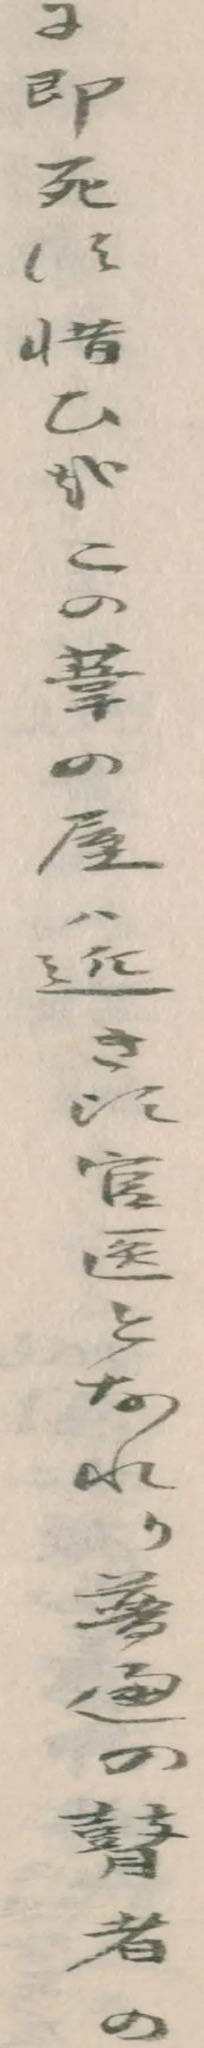に即死す惜ひ哉この葦の屋は近き頃官医となれり普通の瞽者の
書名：地災撮要. 巻7-9(地震之部)
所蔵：国立国会図書館 National Diet Library, JAPAN
